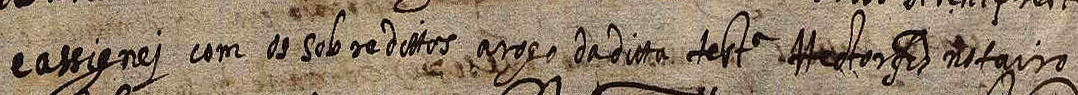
e assignej com os sobredittos a rogo da ditta testa Hector fr̄z notairo
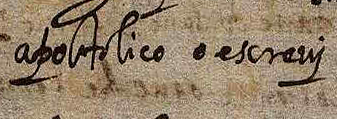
apostolico o escreuj
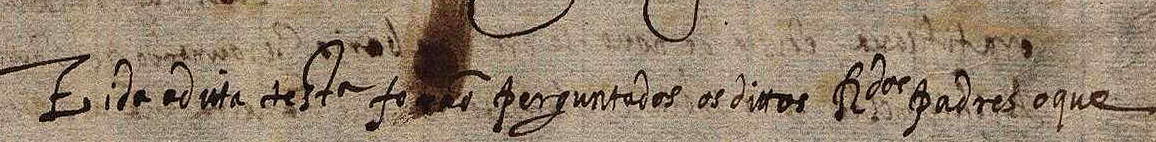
Lida a ditta testa foraõ perguntadas os dittos Rdos padres o que
